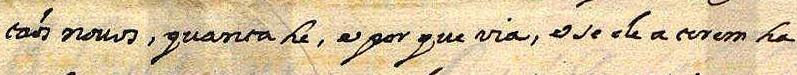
taõs nouos, quanta he, e porque via, e se de a terem ha
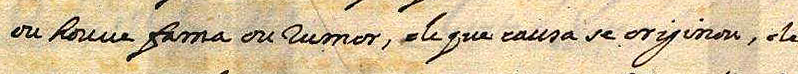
ou houue fama ou Rumor, de que causa se originou, de
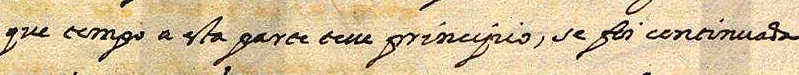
que tempo a esta parte teue principio, se foi continuada
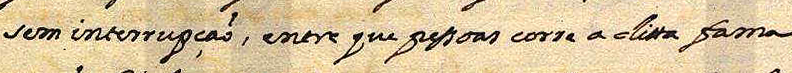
sem interrupçaõ, entre que pessoas corre a ditta fama,
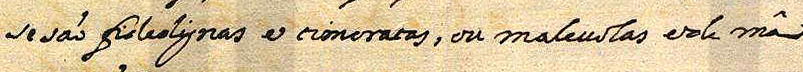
se saõ fidedignas e timoratas, ou maleuolas, e de mâ
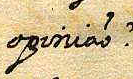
opiniaõ?
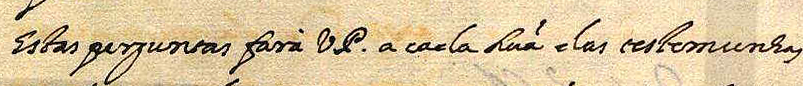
Estas perguntas farà V. P. a cada huā das testemunhas
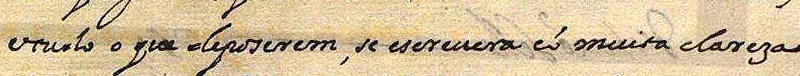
e tudo o que deposerem, se escreuera cō muita clareza
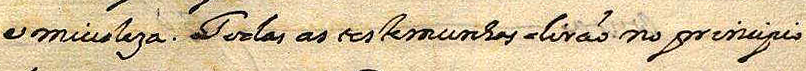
e miudeza. Todas as testemunhas diraõ no principio
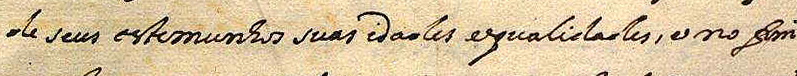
de seus testemunhos suas idades e qualidades, e no fim
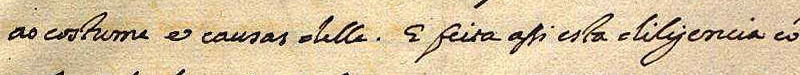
ao costume e causas delle. E feita assi esta diligencia cō
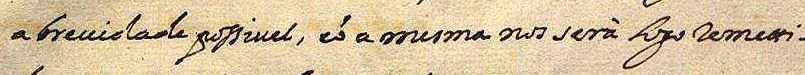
a breuidade possiuel, cō a mesma nos serà logo Remetti
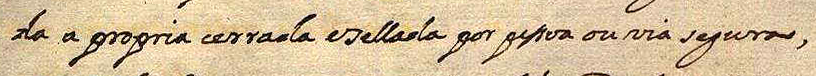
da a propria cerrada e sellada por pessoa ou via segura,
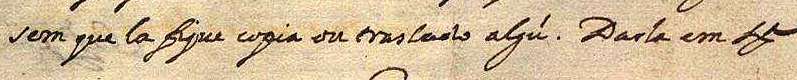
sem que la fique copia ou traslado algū. Dada em Lxa
